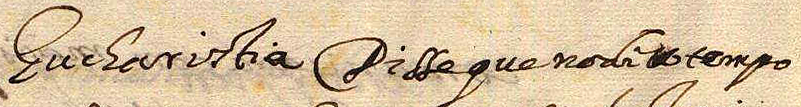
Eucharistia Disse que no ditto tempo
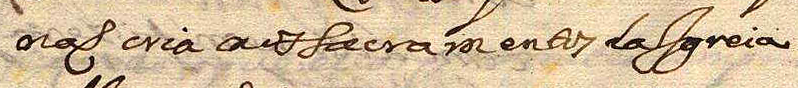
naõ cria nos sacramentos da Jgreia
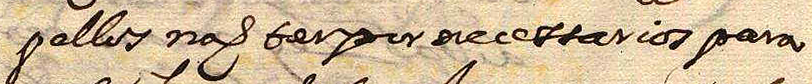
pellos naõ ter por necessarios para
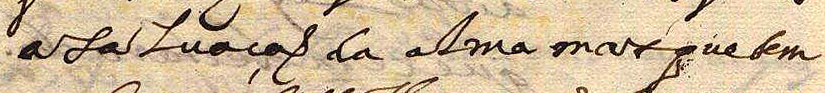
a saluaçaõ da alma mas que sem
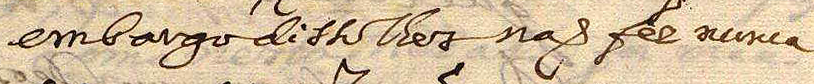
embargo disso lhes naõ fez nunca
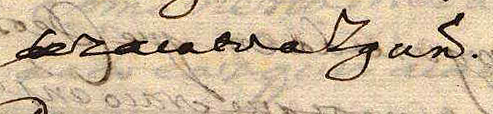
dezacato algun.
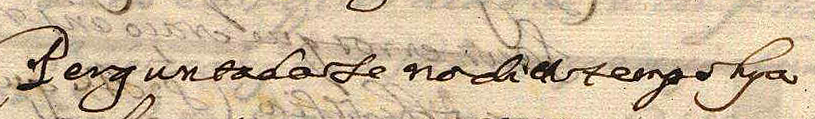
Perguntada se no ditto tempo hya
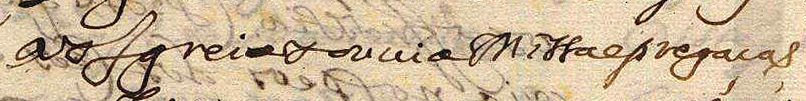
as Jgreias ouuia Missa e pregaçaõ
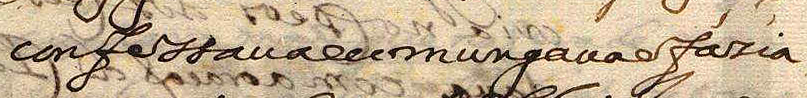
confessaua e comungaua e fazia
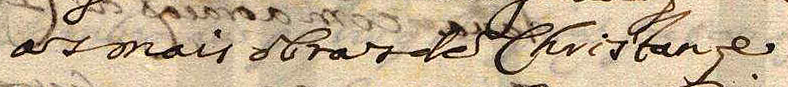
as mais obras de Christan, e
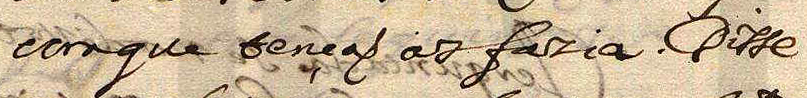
com que tençaõ as fazia. Disse
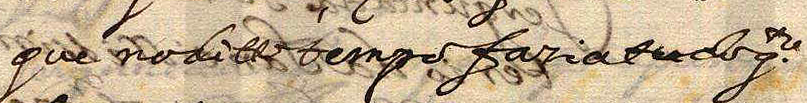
que no ditto tempo fazia tudo q.to
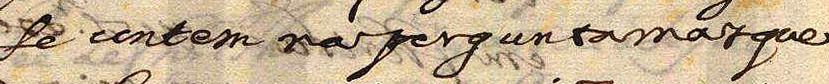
se contem na pergunta mas que
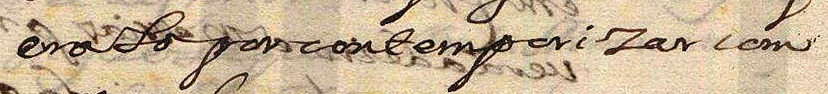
era so por contemporizar com
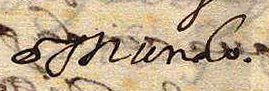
o Mundo.
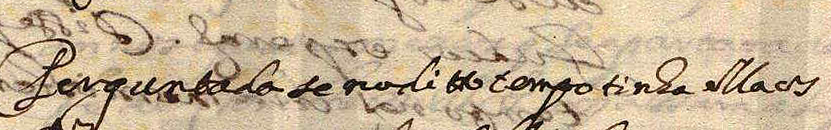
Perguntada se no ditto tempo tinha ella os
